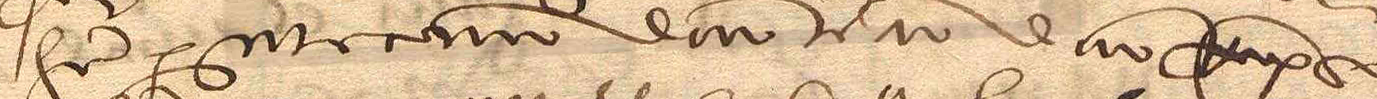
hū ꝑsente como dito tem ao dito Reo p̄so
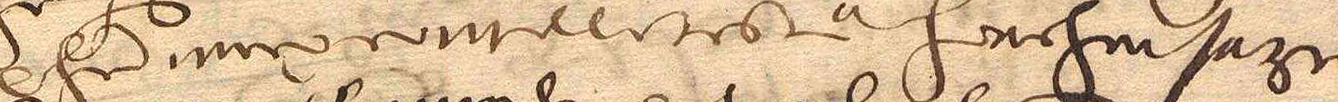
e hū moço com elle testa ho achou Jazer
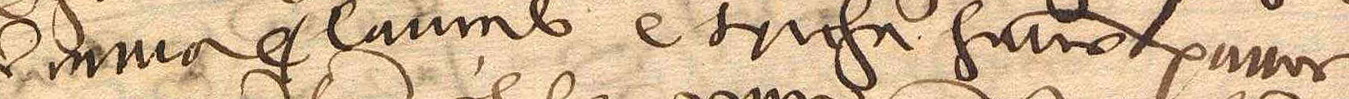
ē cama e lançado e tynha huūs panos
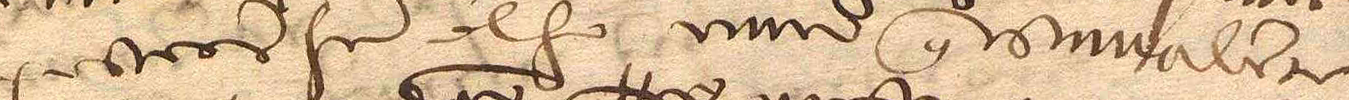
postos ē hū olho como q̄ estaua doēte
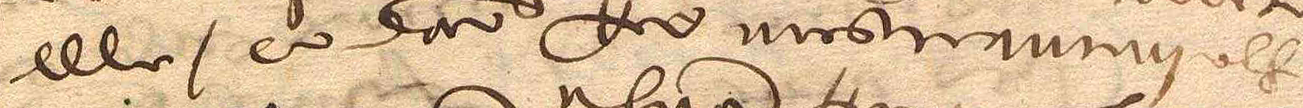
delle / e o dito Reo mestre antonjo lhe
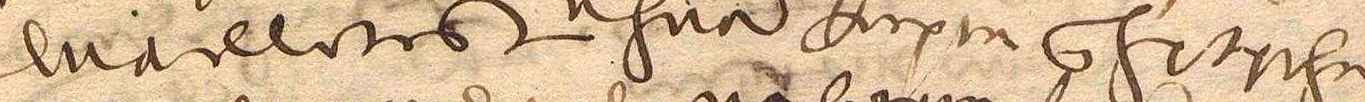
deu a elle testa huā Recepta q̄ hy tynha
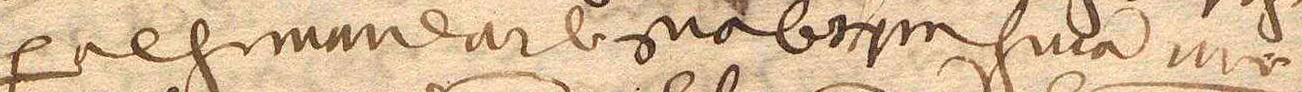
ꝑa lhe mandar de sua botyca huuā me
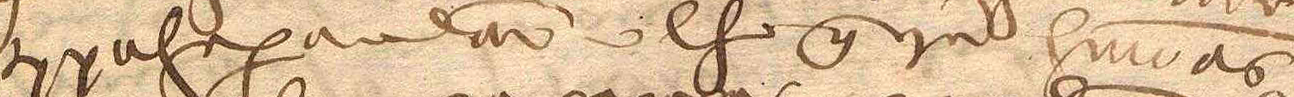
zynha ꝑa o dito olho q̄ erā hūuas
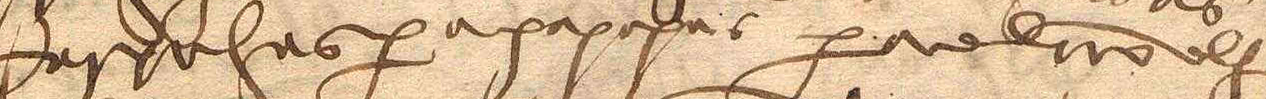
farynhas ꝑa papapas ꝑa o dito olho
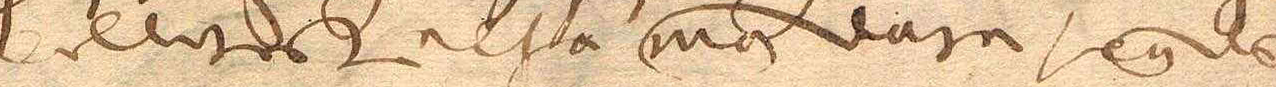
e elle testa lha mandara / e q̄ des
